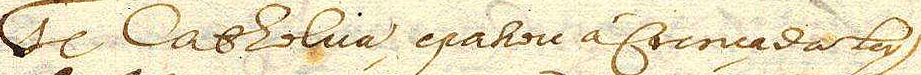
Fe Catholica, e passou á Crença da Ley
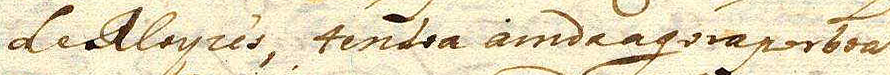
de Moyzés, tendoa ainda agora por boa
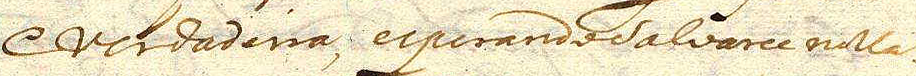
e verdadeira, esperando salvarce nella.
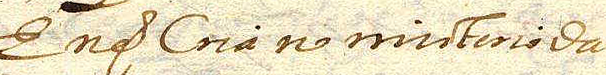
E naõ Cria no misterio da
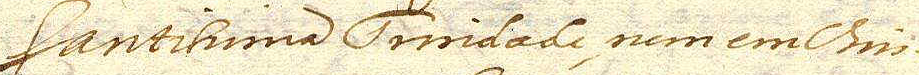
Santissima Trindade, nem em Chris
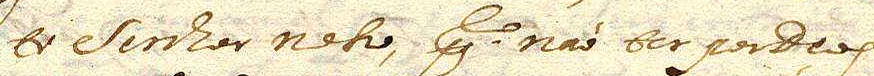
to Senhor nosso, plo. naõ ter por Deos
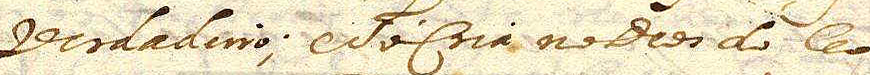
Verdadeiro; e só Cria no Deos do Ceo
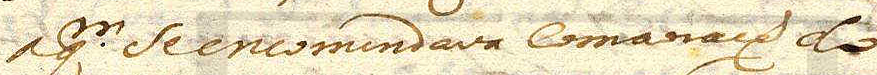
a qm. se encomendava com a oraçaõ do
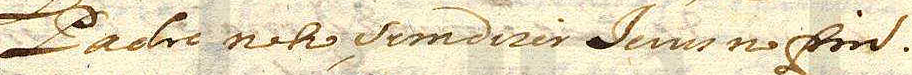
Padre nosso sem dizer Iesus no fim.
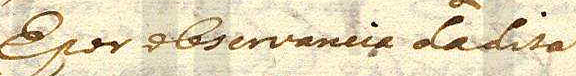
E por observancia da dita
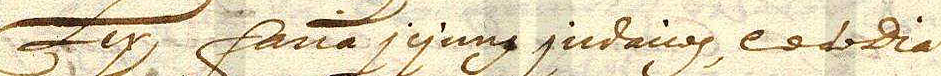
Ley, fazia jejuns judaicos, e o do Dia
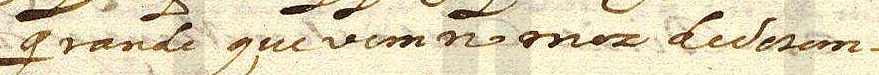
grande que vem no mez de setem
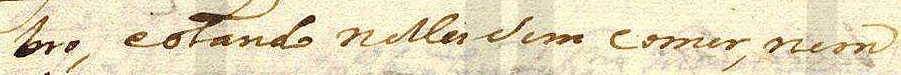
bro, estando nelles sem comer, nem
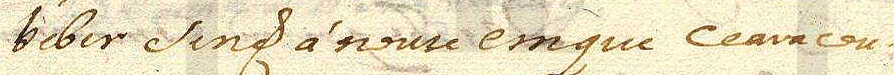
beber senaõ á noute em que ceava cou
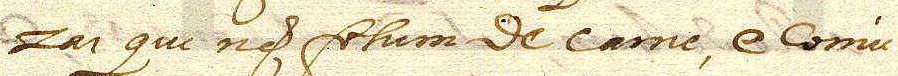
zas que naõ fossem de carne, e comu
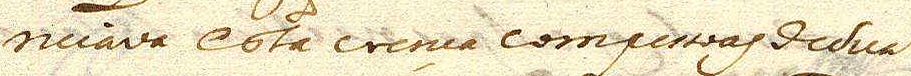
nicava esta crença com pessoas de sua
